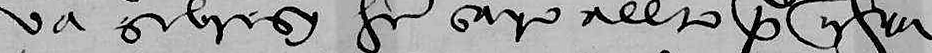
va sobre sy hū sayo allto p̄oq̄ hya
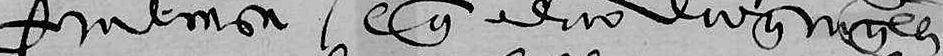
fora de casa / e q̄ o dito dioguo ḡllz
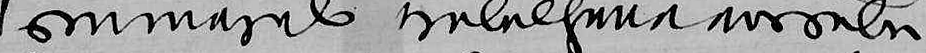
seu marydo trabalhaua aos saba
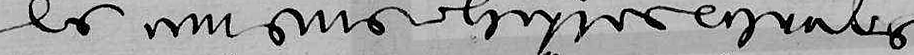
dos com seus obreyros e cryados
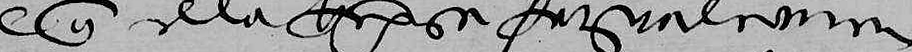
e q̄ ella Re p̄sa fazya de comer
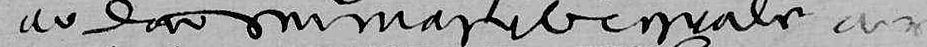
ao dito seu marydo e cryados aos
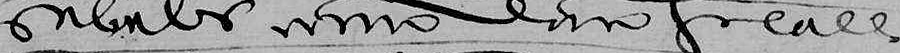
sabados como dito he e all
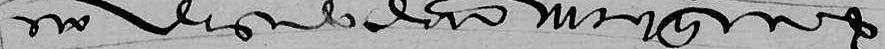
n̄o dise do dito artyguo
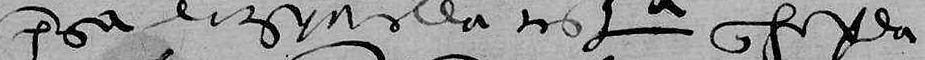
p̄sa dizya ella testa q̄ he ꝟda
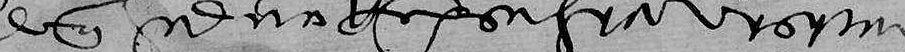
de q̄ ha dita Re p̄sa hya vysytar
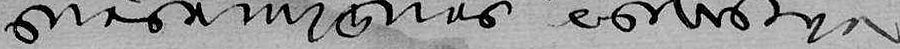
suas amjguas e se vestya
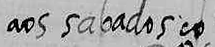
aos sabados co
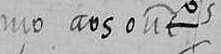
mo aos outros
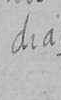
dias
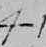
41
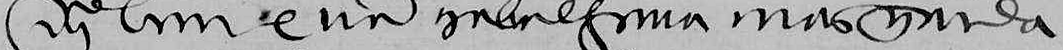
mto bem e nā trabalhaua mas garda
